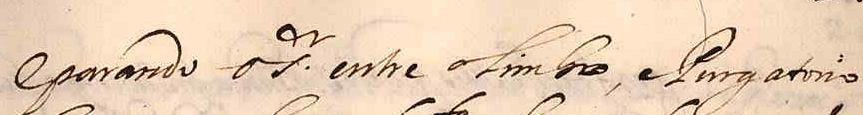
e parando o s.or entre o Limbo, e Purgatorio
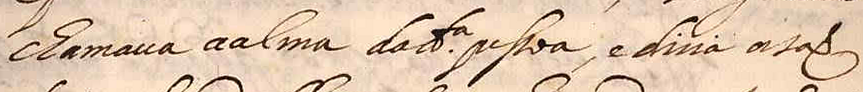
chamaua a alma da d̄a pessoa, e dizia a saõ
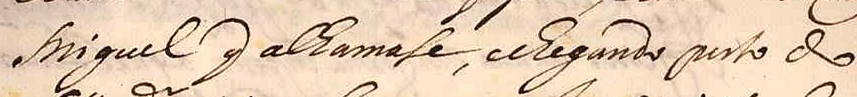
Miguel q̄ a chamase, e chegando perto do
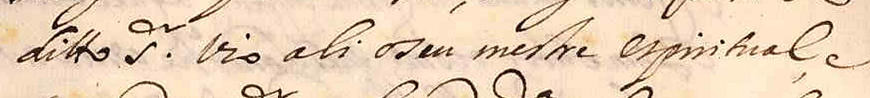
ditto s.or vio ali o seu mestre espiritual, e
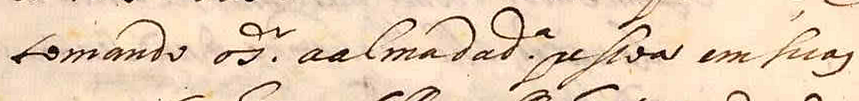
tomando o s.or a alma da d.a pessoa em suas
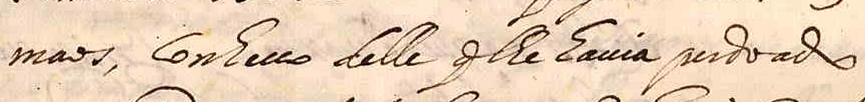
maos, conheceo delle q̄ lhe hauia perdoado
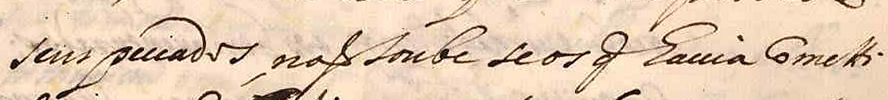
seus peccados, naõ soube se os q̄ hauia cometti
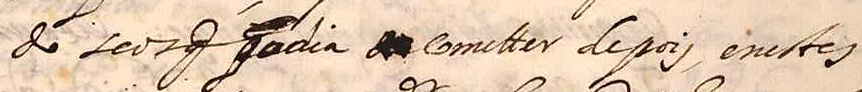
do seos q̄ podia _ cometter depois, e nestes
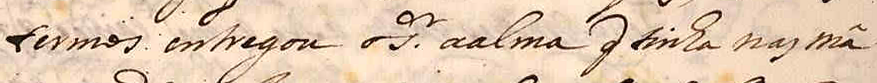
termos entregou o s.or a alma q̄ tinha nas mã
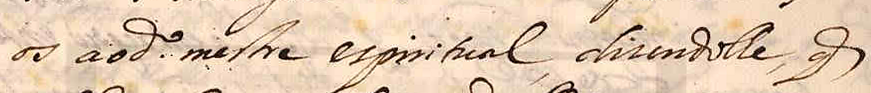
os ao d.o mestre espiritual, dizendolhe q̄
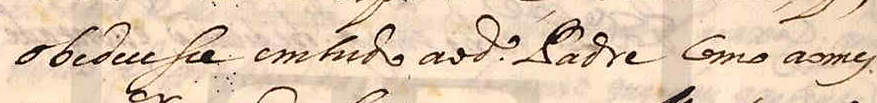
obedecesse em tudo ao d.o Padre Como ao mes
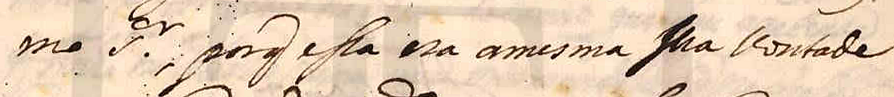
mo s.or, porq̄ essa era a mesma sua Vontade
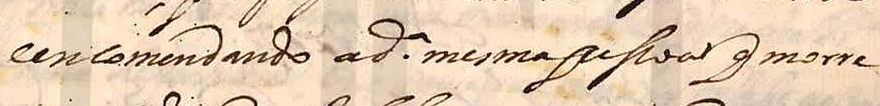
e encomendando a d.a mesma pessoa q̄ morre
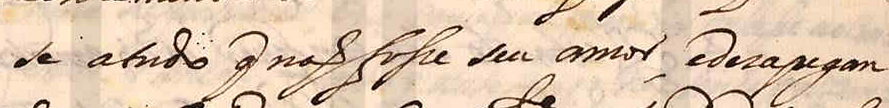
se a tudo q̄ naõ fosse seu amor, e dezapegan
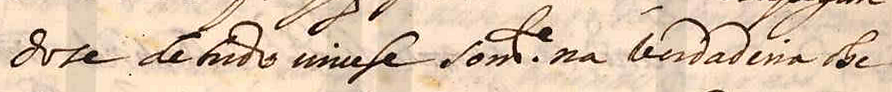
dose de tudo uiuese somte na verdadeira obe
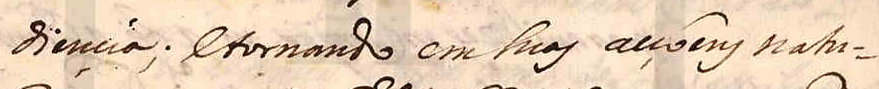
diencia; e tornando em suas acçõens natu
